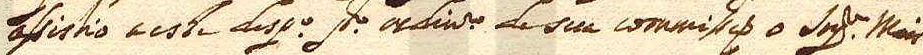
assistio a este desp.o p.lo ordin.ro de sua commissaõ o Inq.or Mais
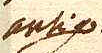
antigo.
